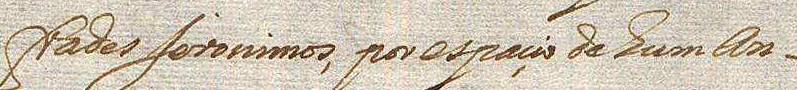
frades Jeronimos, por espaçio de hum an
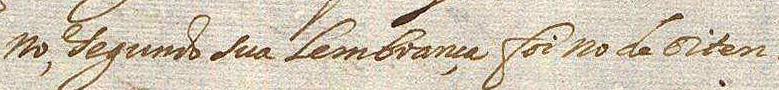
no, e segundo sua lembrança foi no de oiten
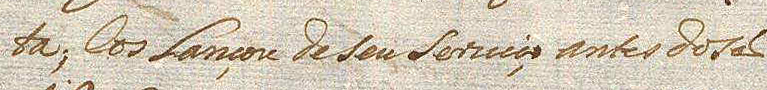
ta; e os lançou de seu seruiço antes do saõ
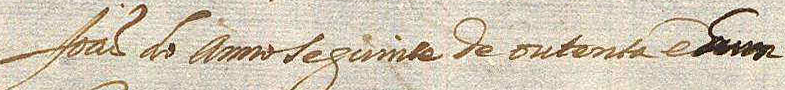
Joaõ do anno seguinte de outenta e hum
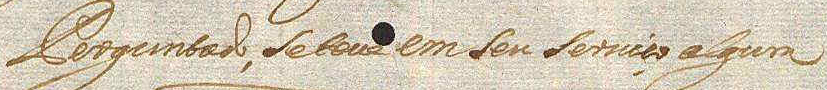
Perguntado, se teue em seu seruiço algum
